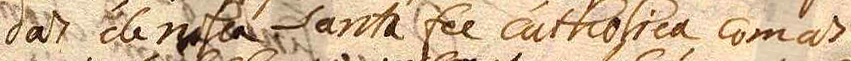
das de nossa Santa fee catholica, com as
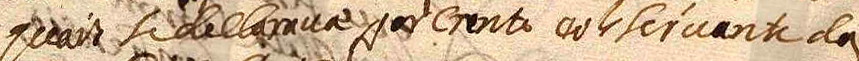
quais se declaraua por crente e obseruante da
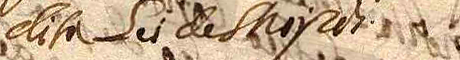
dita Lei de Moyzes.
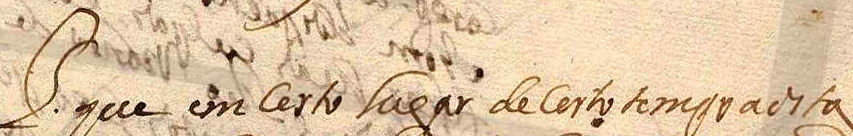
P. que em certo Lugar de certo tempo a esta
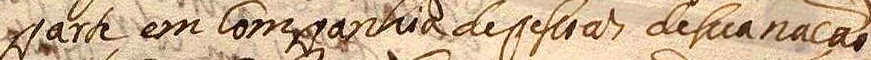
parte, em Companhia de pessoas de sua nação
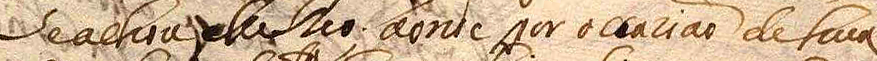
se achou elle Reo; aonde por occaziaõ de huā
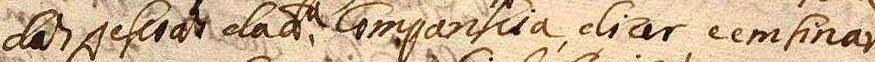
das pessoas da d.a Companhia, dizer e emsinar
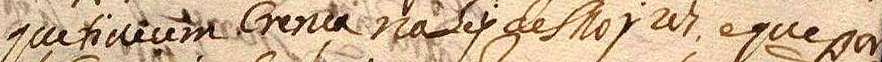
que tiuecem Crença na Ley de Moyzes, e que por
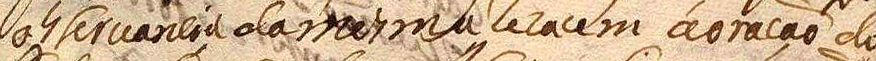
obseruançia da mesma Rezacem á oraçaõ do
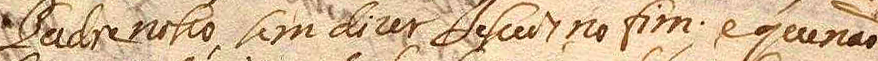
Padre nosso, sem dizer Iesus no fim; e que não
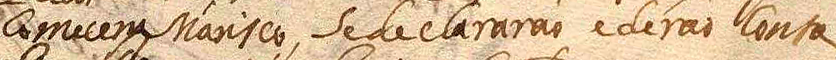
comecem Marisco, se declararaõ e derao conta
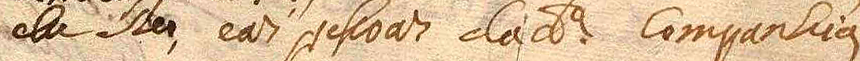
elle Reo, e as pessoas da d.a Companhia
